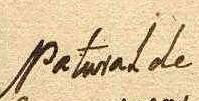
Natural de
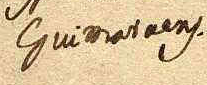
Guimaraens.
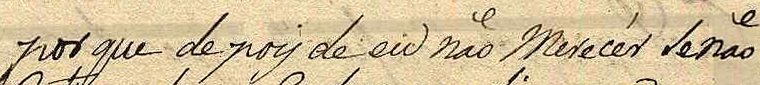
por que depois de eu não Merecér se não
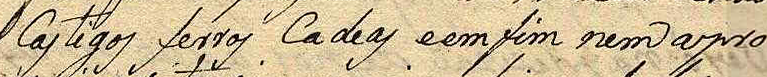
Castigos ferros Cadeas e emfim nem a pro
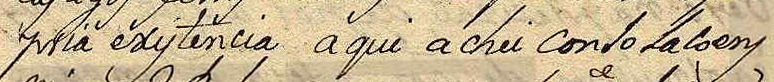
pria existencia aqui achei consoLacoens
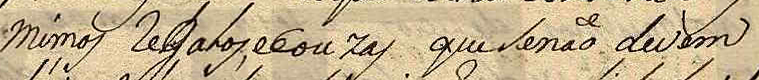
mimos Regalos, e couzas que senão devem
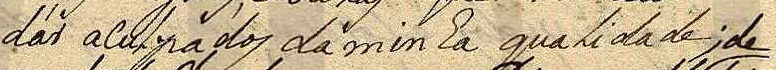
dár a culpados da minha qualidade; de
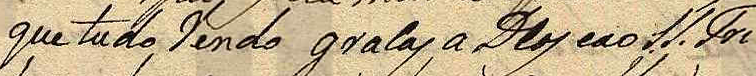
que tudo rendo graCas a Deos e ao SS. Tri
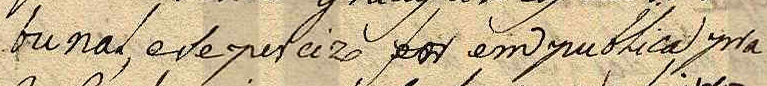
bunal, e se percizo for em pubLica pra
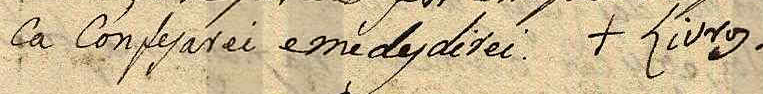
Ca Confesarei e me desdirei. + Livros.
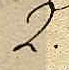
2.
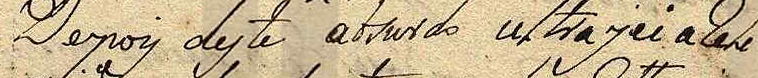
Depois deste absurdo ultrajei a ReLi
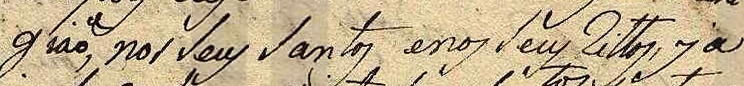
giaõ, nos seus Santos e nos seus Rittos, ja
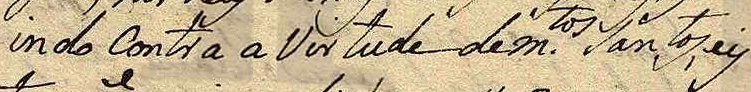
indo Contra a Virtude de m.tos santos, e is
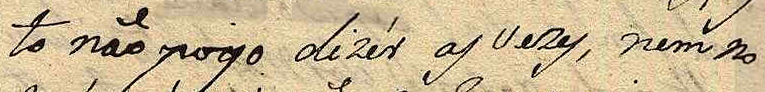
to não poso dizér as vezes, nem no
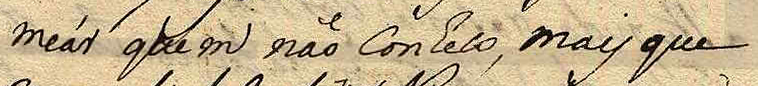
meár quem naõ Conheco, mais que
